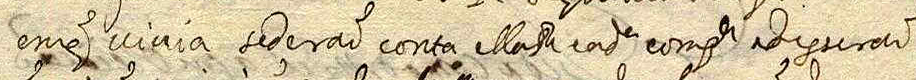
em q̄ uiuia se deraõ conta ella Re e a da compa a disseraõ
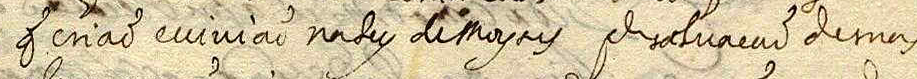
q̄ criaõ e uiuiaõ na ley de Moyses pa saluaçaõ de suas
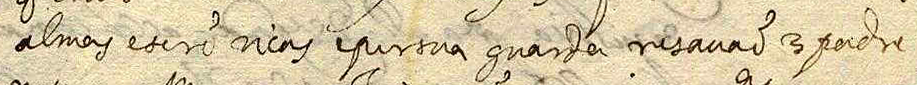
almas e serē ricas e por sua guarda resauaõ 3 padre
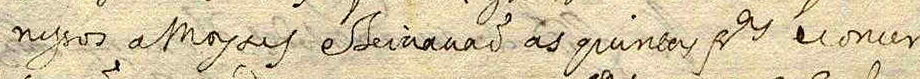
nossos a Moyses e Ieiuauaõ as quintas fas e concer
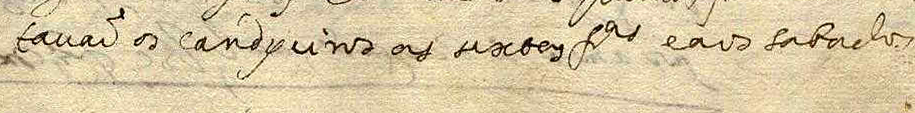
tauaõ os candyeiros as sextas fras e aos sabados
